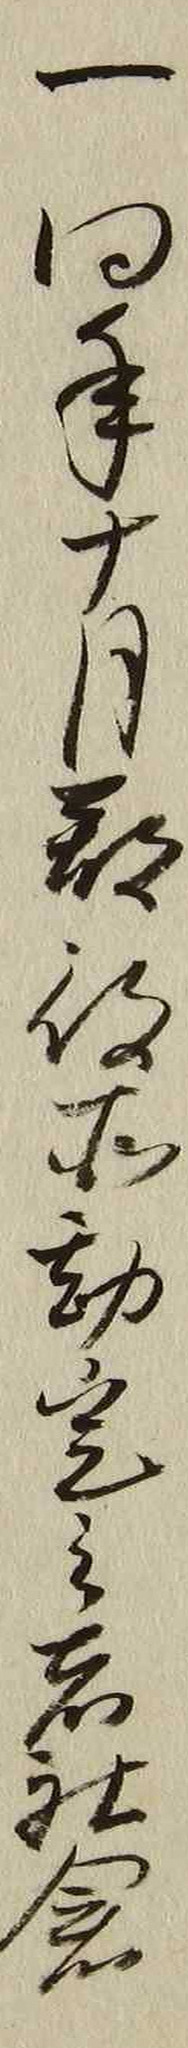一同年十月郡役所勘定之者社倉
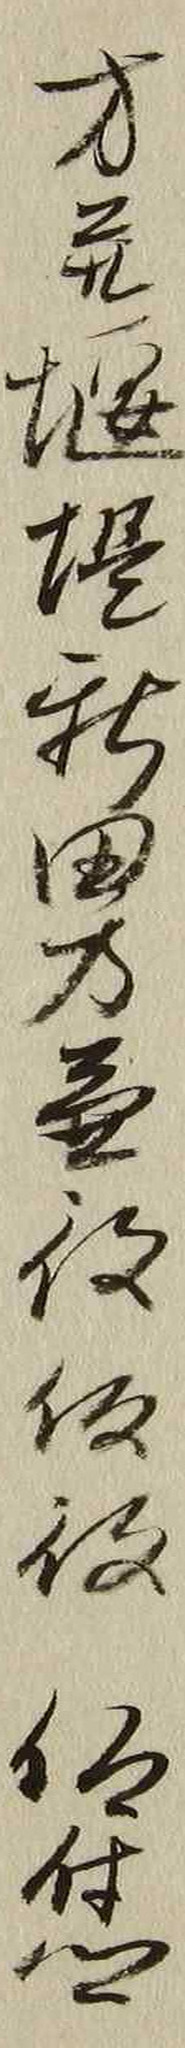方并堰堤新田方兼役仮役仰付郷
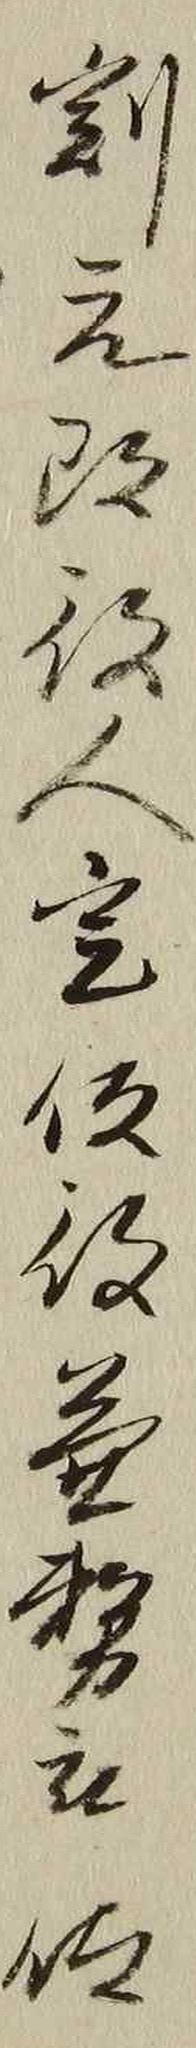割元改役人定仮役兼務被仰
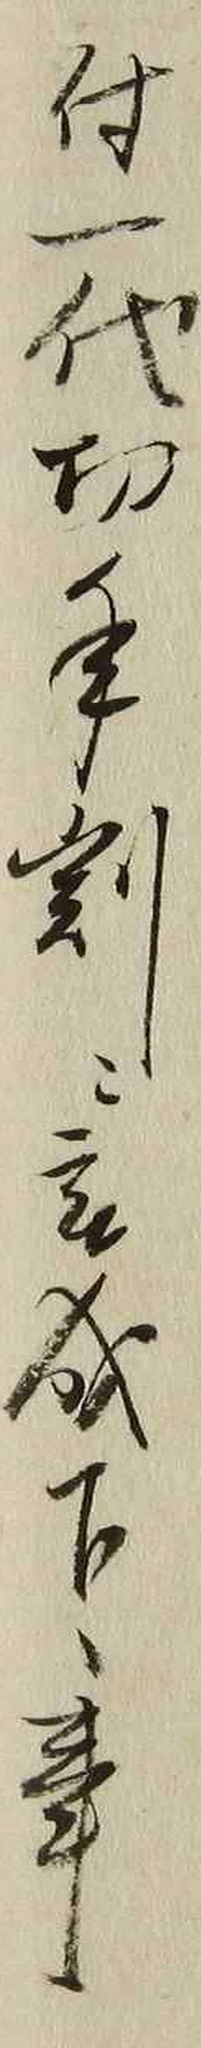付一代切年割ニ被成下候事
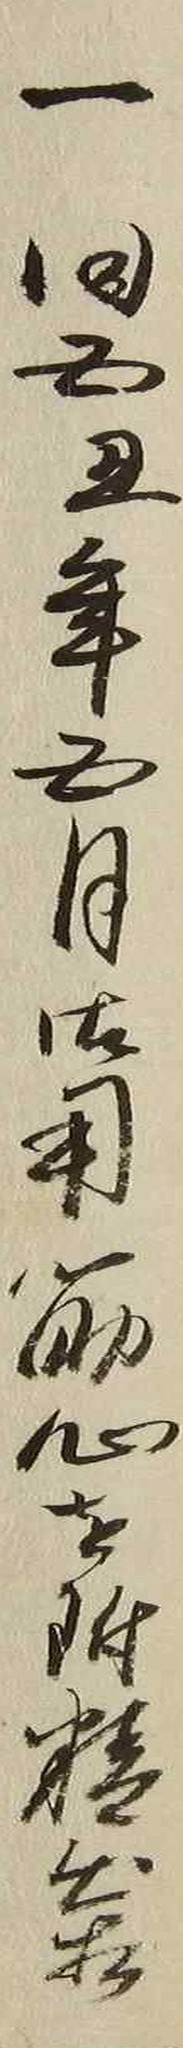一同五丑年五月御用筋心を附精出相
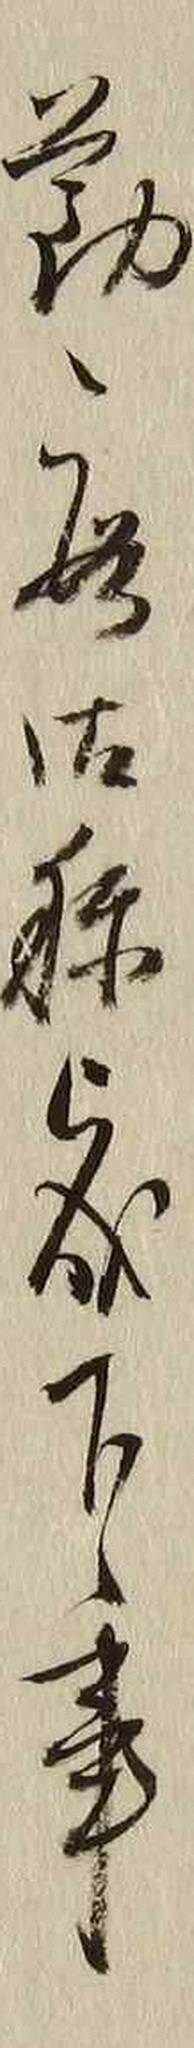勤候段御称被成下候事
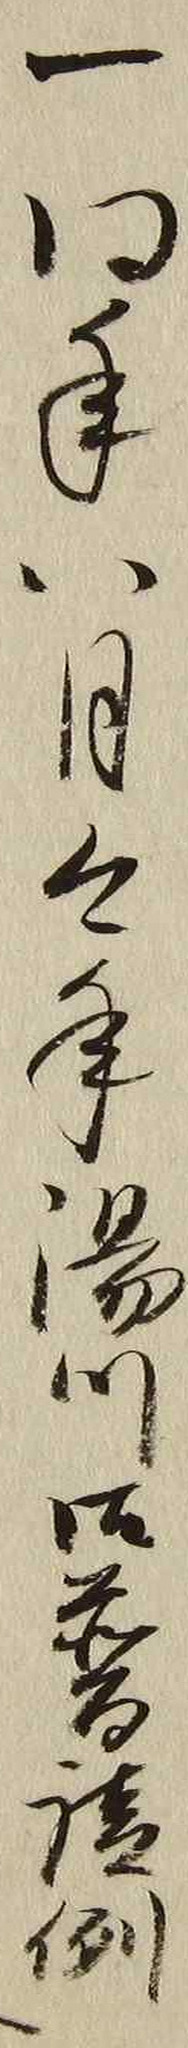一同年八月今年湯川御普請例
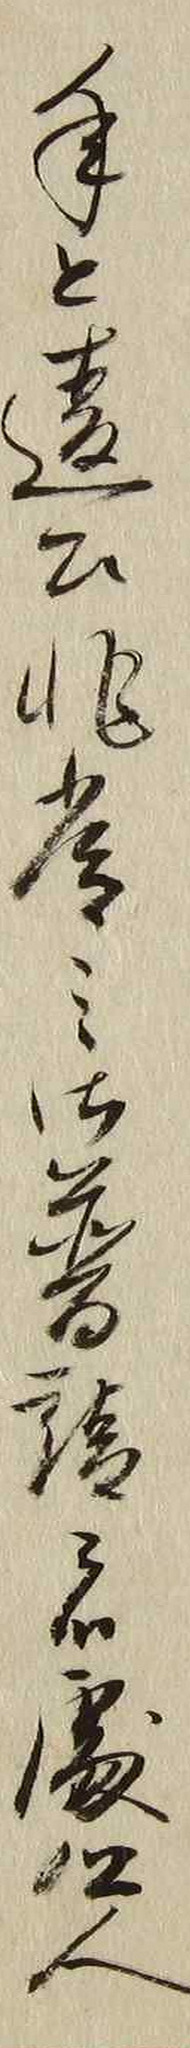年と違ひ非常之御普請ニ候処郷人
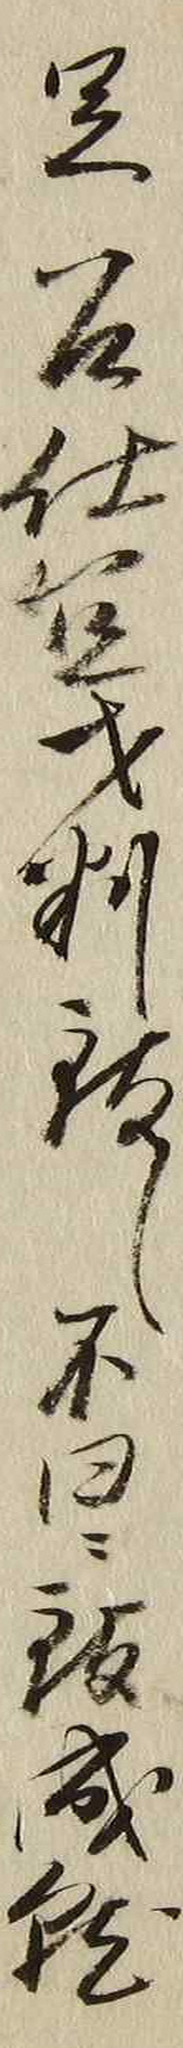足召仕宜才判致し不日ニ致成就
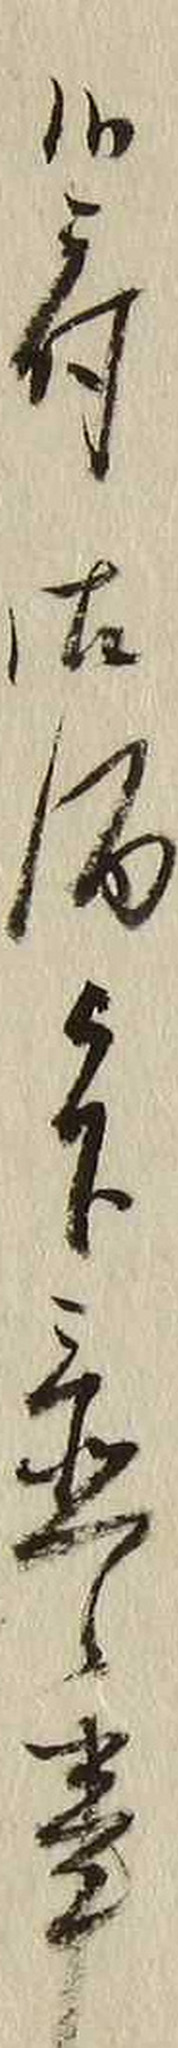候ニ付御酒被下置候事
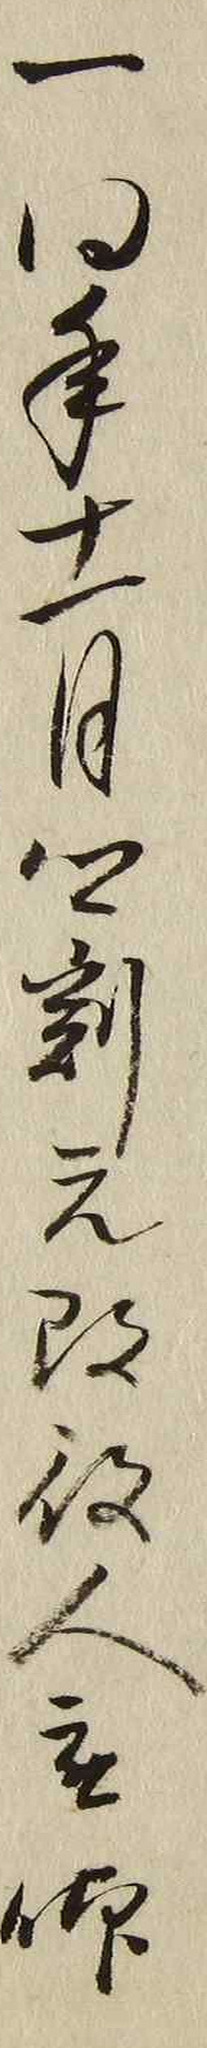一同年十一月郷割元改役人被仰
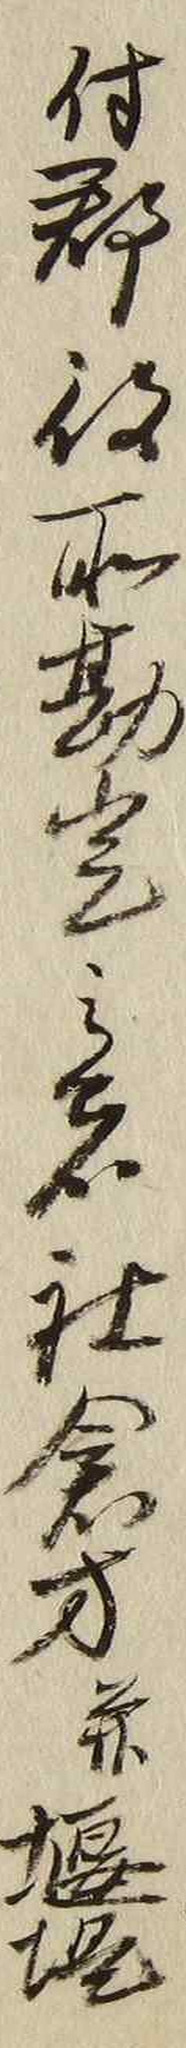付郡役所勘定之者社倉方并堰堀
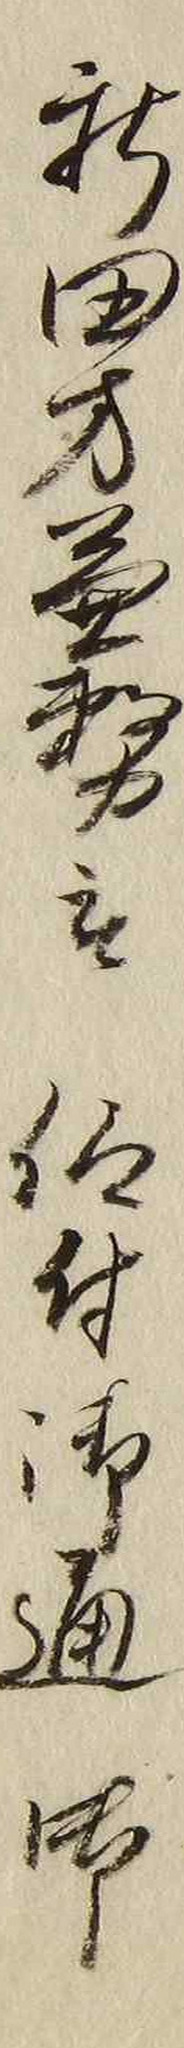新田方兼務被仰付御通御
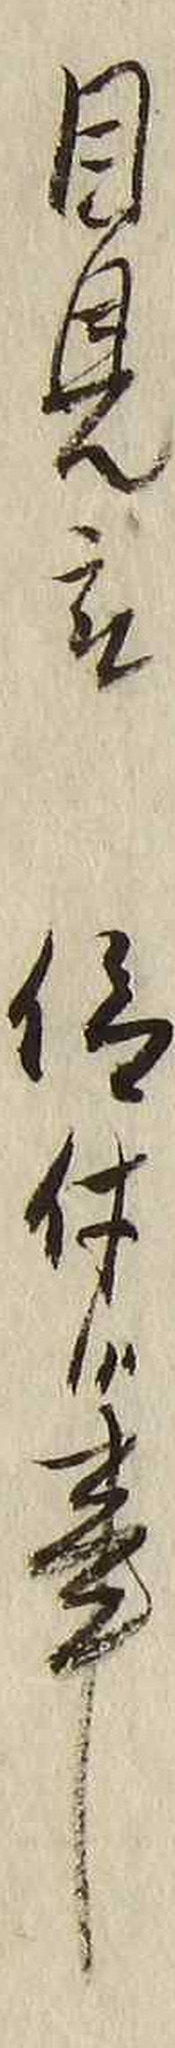目見被仰付候事
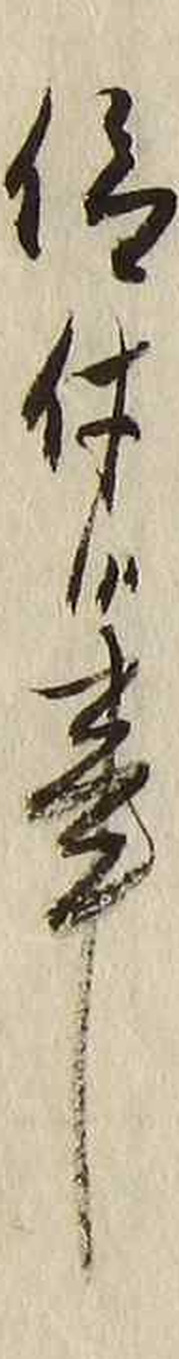仰付候事
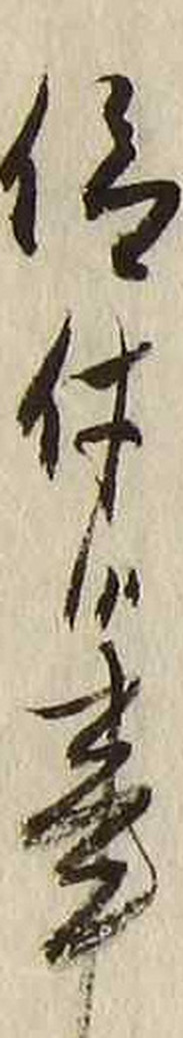仰付候事
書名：諸士系譜　巻之352　す之部2
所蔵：会津若松市立会津図書館
